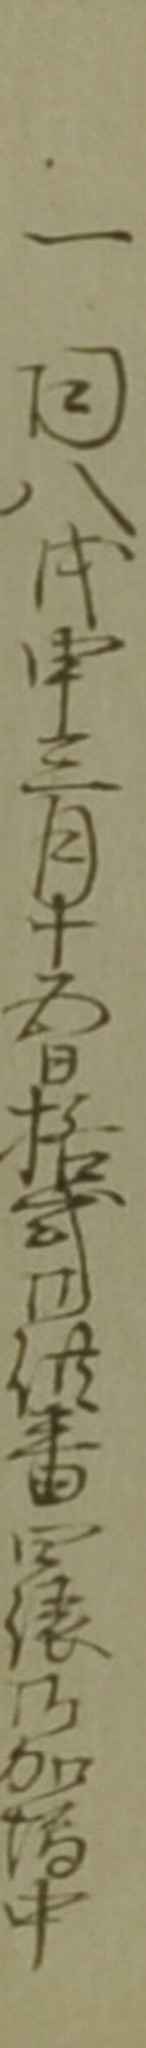一同八戊申三月十五日格式御供番四俵御加増中
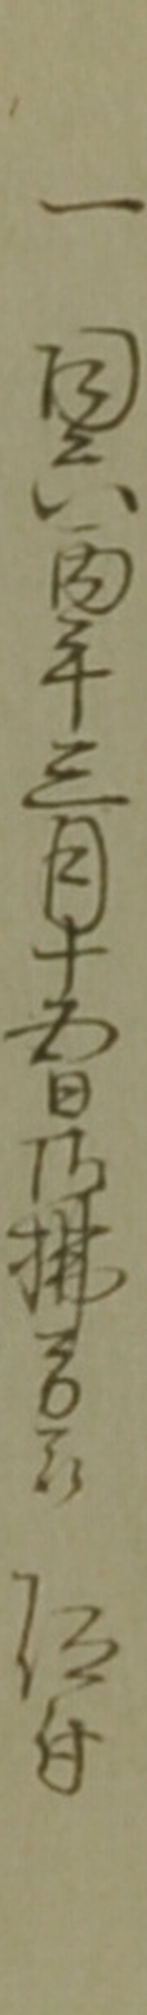一同六丙午三月十五日御払方被仰付
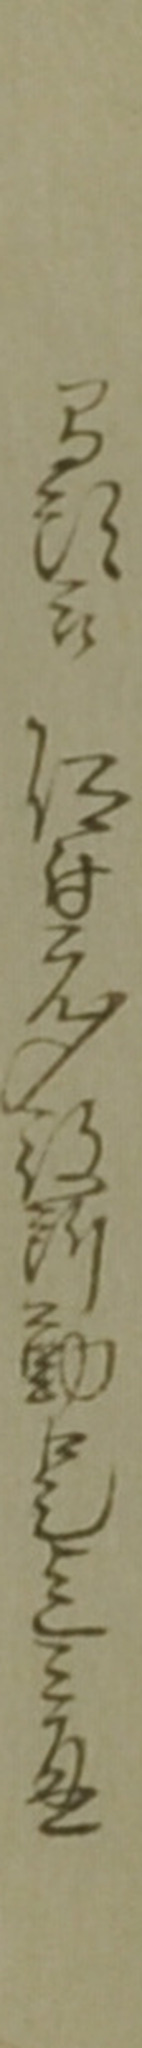間頭被仰付元〆役所勤是迄之通
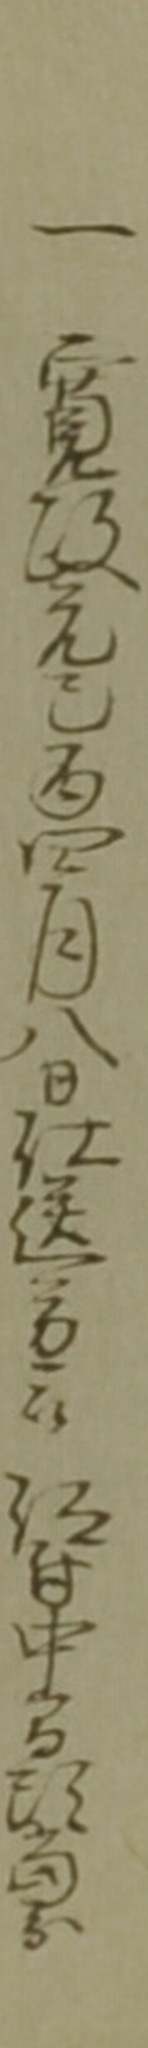一寛政元己酉四月八日仕送方被仰付中間頭当分
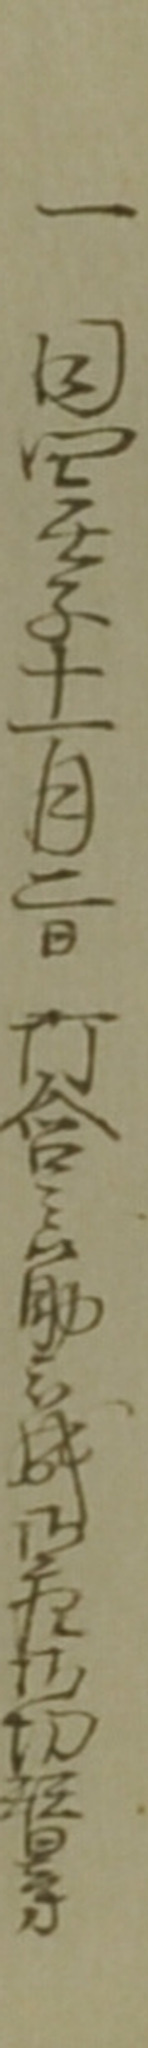一同四壬子十一月二日御含之筋被成御座御切替旁
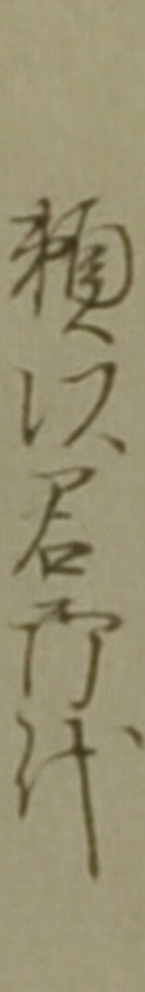頼以君御代
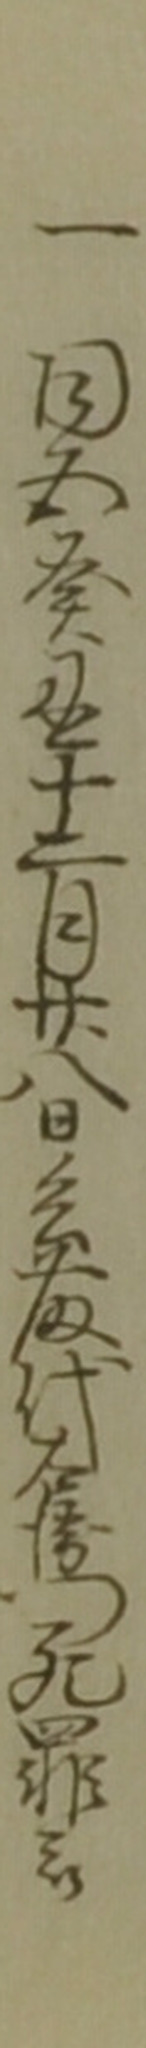一同五癸丑十二月廿八日糸藤代右衛門死罪被
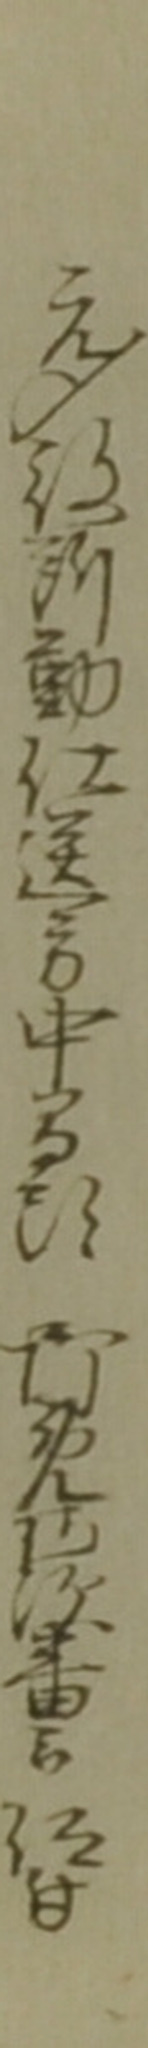元〆役所勤仕送方中間頭御免御次番被仰付
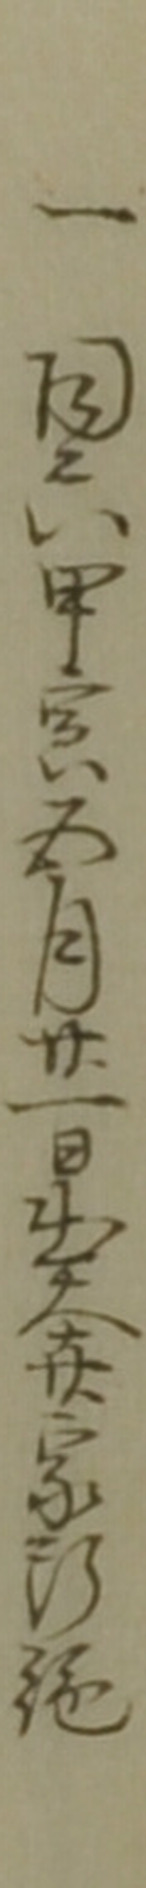一同六甲寅五月廿一日出奔断絶
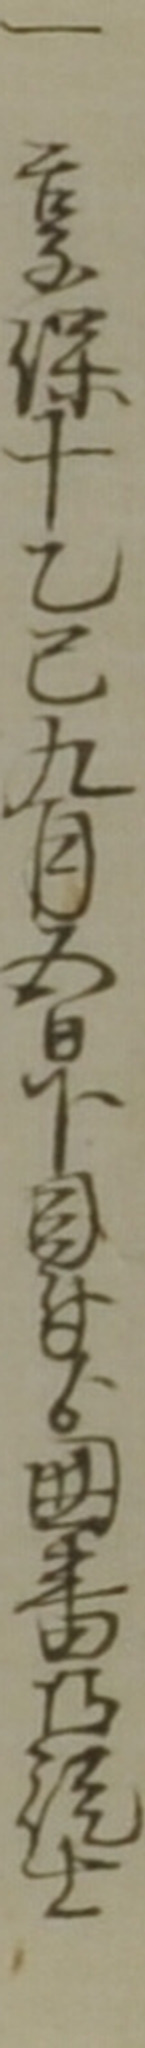一享保十乙巳九月五日下目付ゟ囲番御徒士
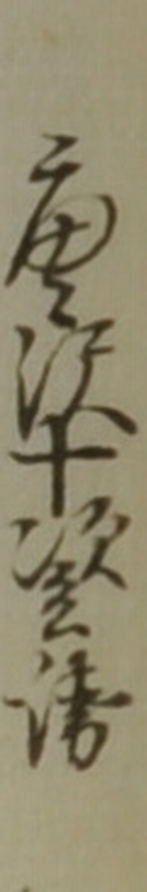唐沢十次兵衛
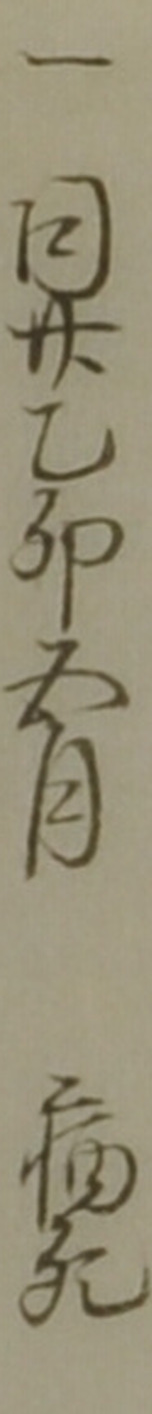一同廿乙卯五月病死
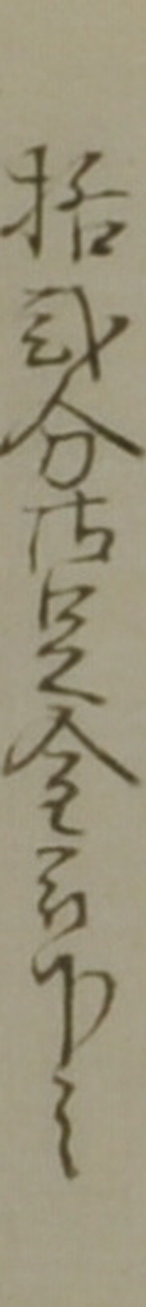格弐分御足金被下之
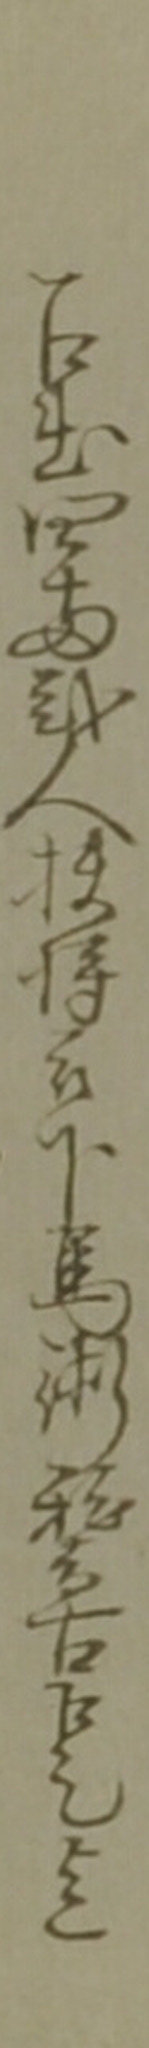召出四両弐人扶持被下馬術稽古是迄
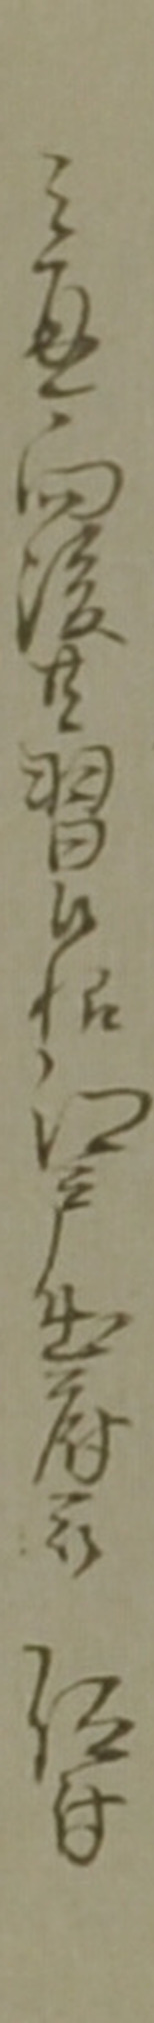之通向後共習候様江戸出府被仰付
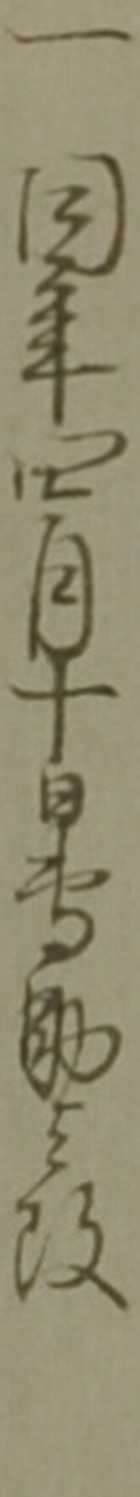一同年四月十日専助与改
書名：無足廃家（壱）
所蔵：伊那市立高遠町図書館・合同会社AMANE
